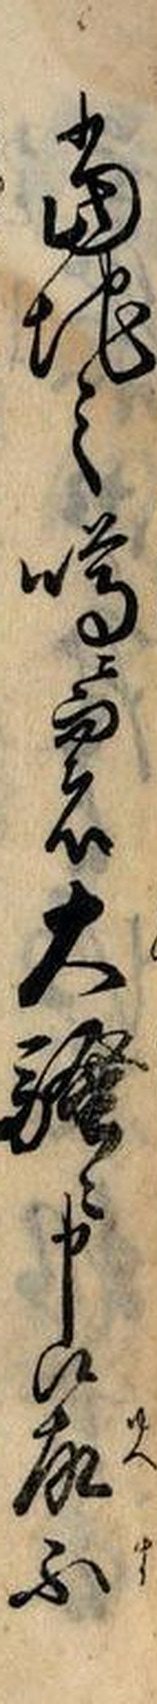当地之噂に而者大騒に申候故不
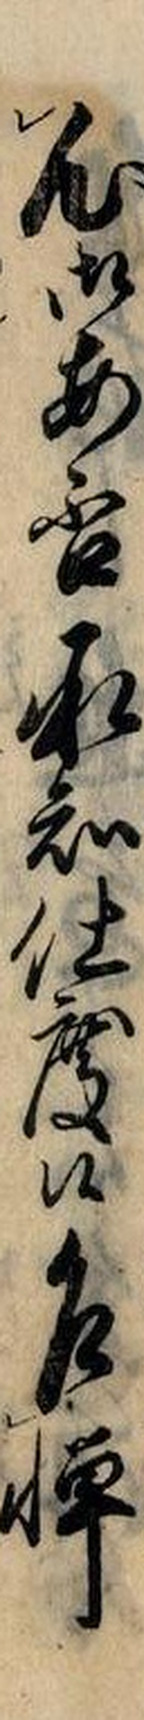心御安否承知仕度候乍憚
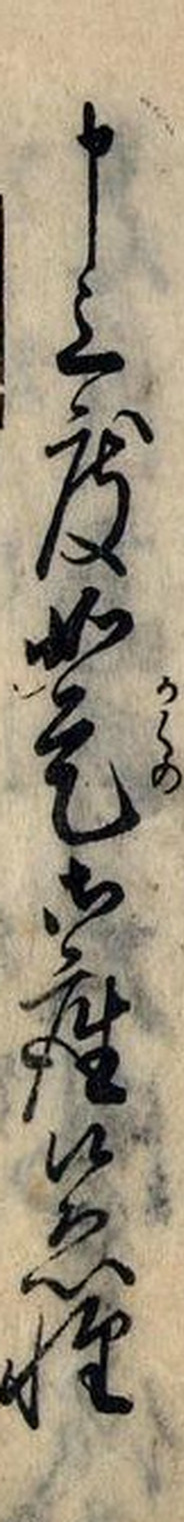申上度如是御座候恐惶
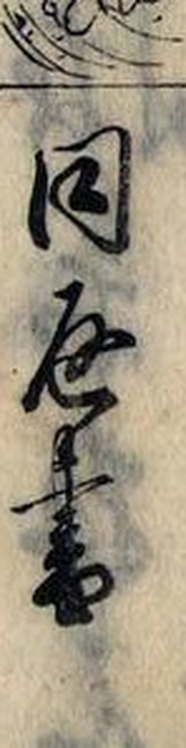同返書

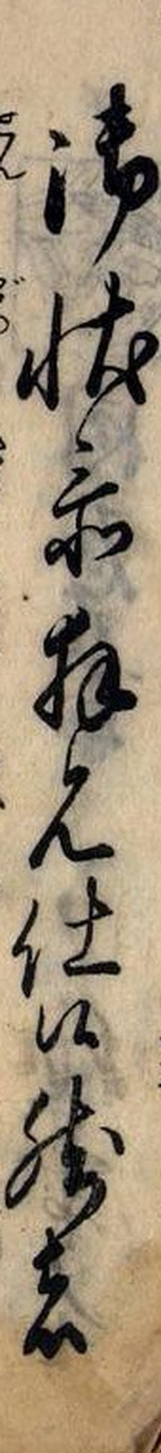御状忝拝見仕候然者
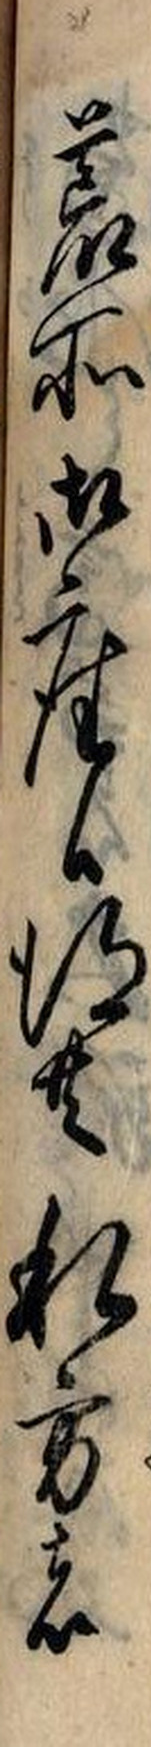荒所御座候得共私方者
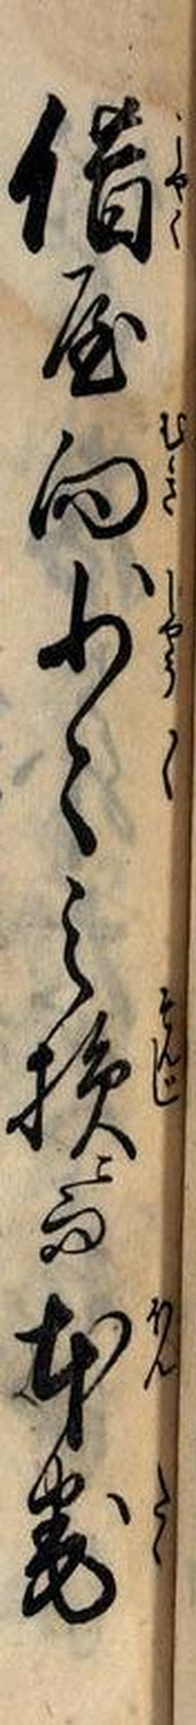借屋向少々之損に而本宅
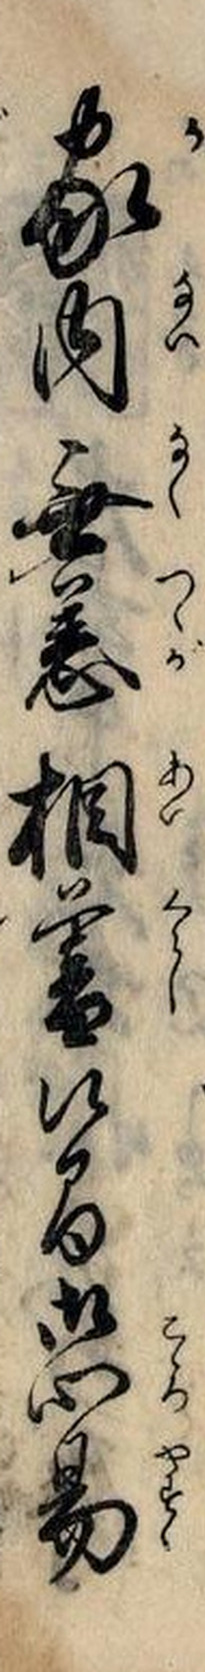家内無恙相暮候間御心易
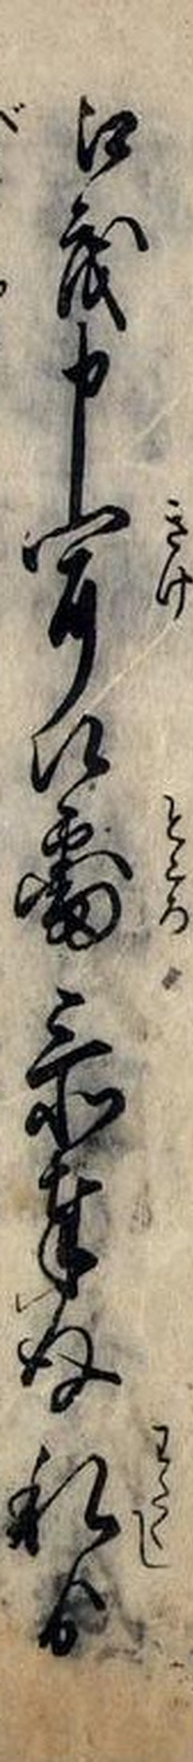江も申聞候處忝奉存私ゟ

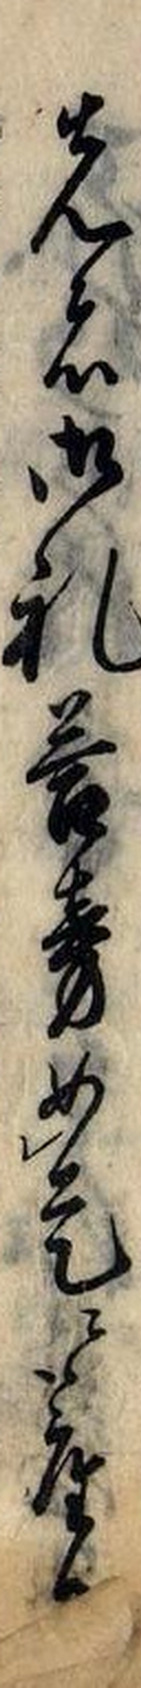先者御礼答旁如是に御座候
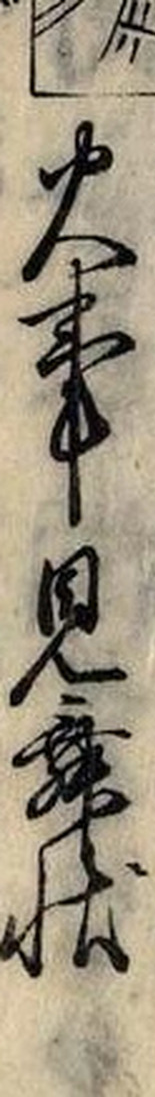火事見舞状
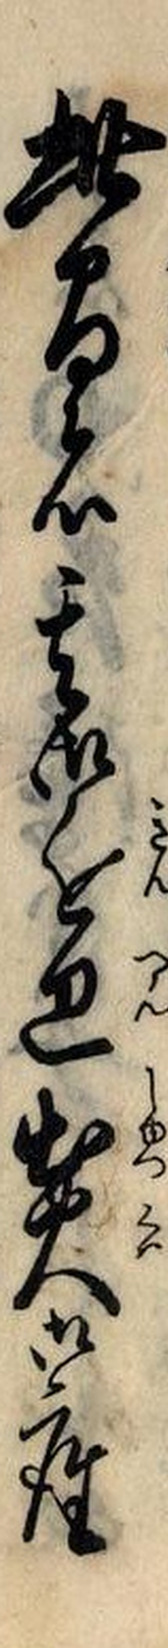此間者其御近辺出火御座
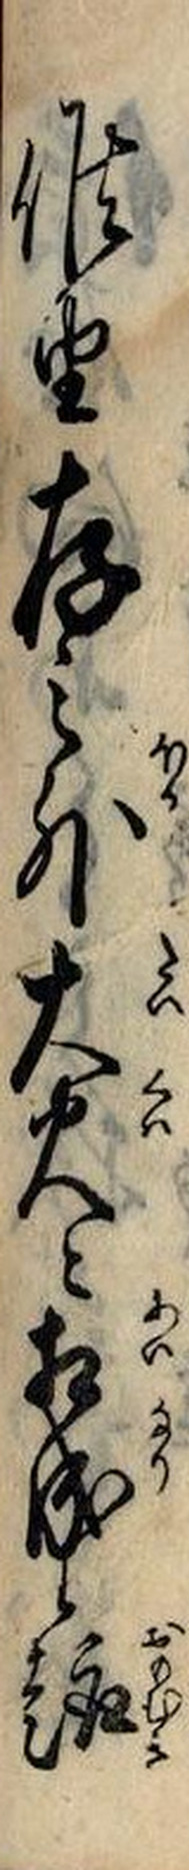候由存之外大火と相成候趣
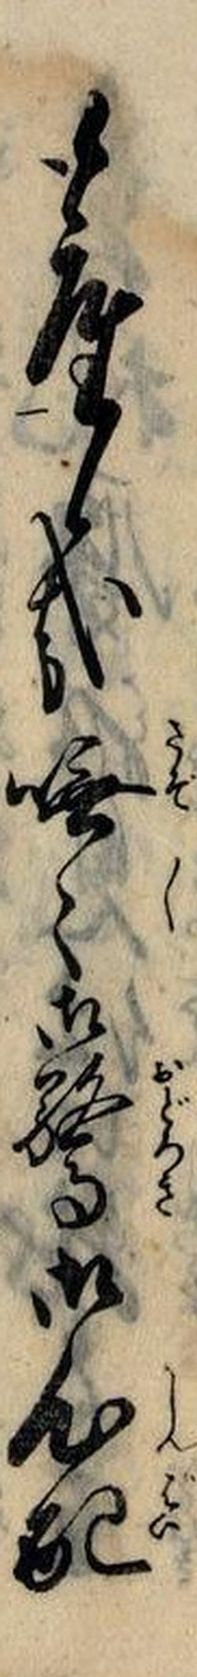御座候哉嘸々御驚御心配
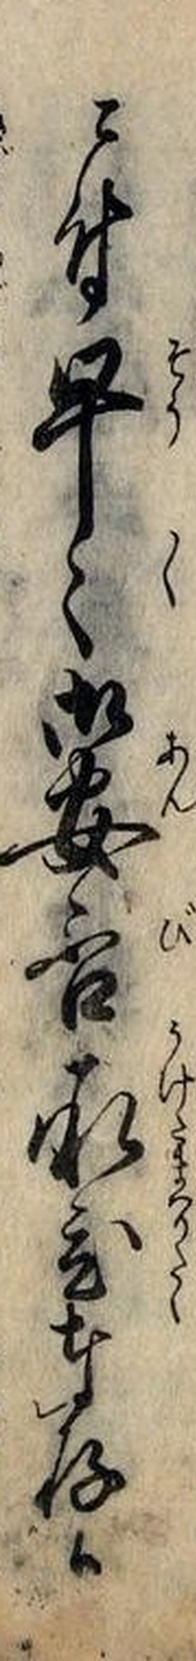に付早々御安否承度奉存候

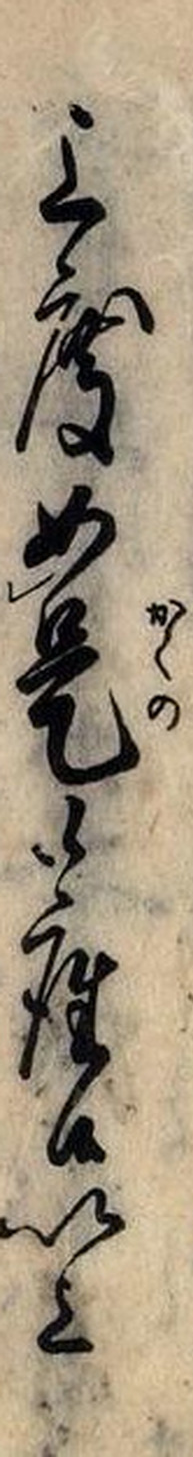上度如是御座候以上
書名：大成用文章（往来物）
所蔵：福井県文書館 Fukui Prefectural Archives
